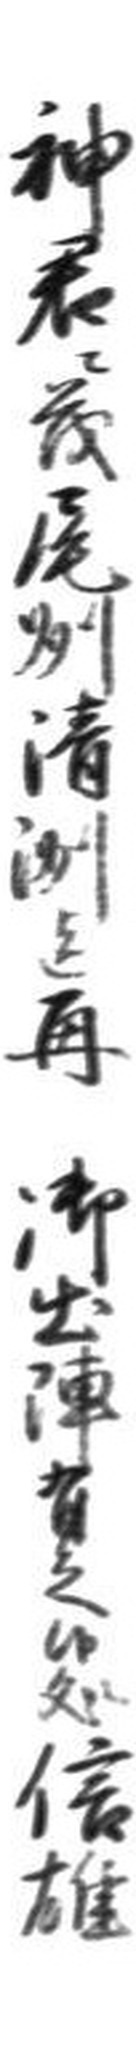神君ニ茂尾州清洲迄再御出陣有之候処信雄
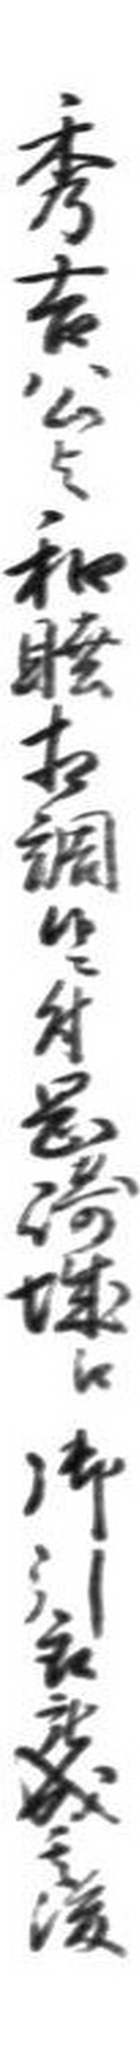秀吉公与和睦相調候ニ付岡崎城江御引取被成其後
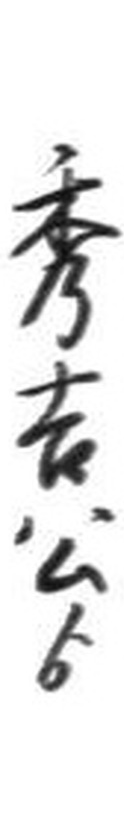秀吉公ゟ

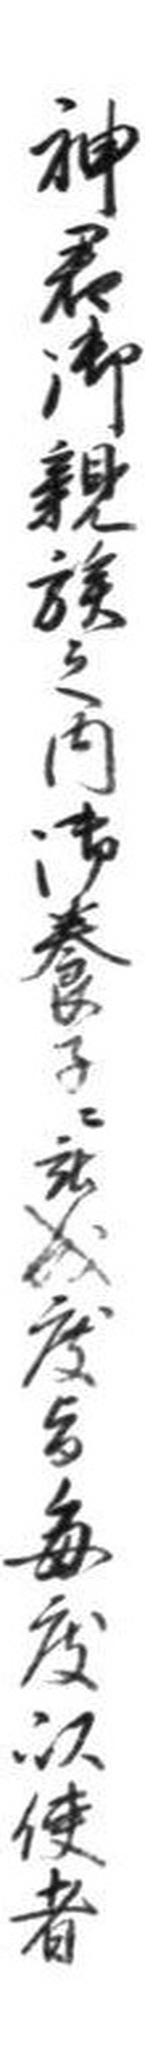神君御親族之内御養子ニ被成度旨毎度以使者
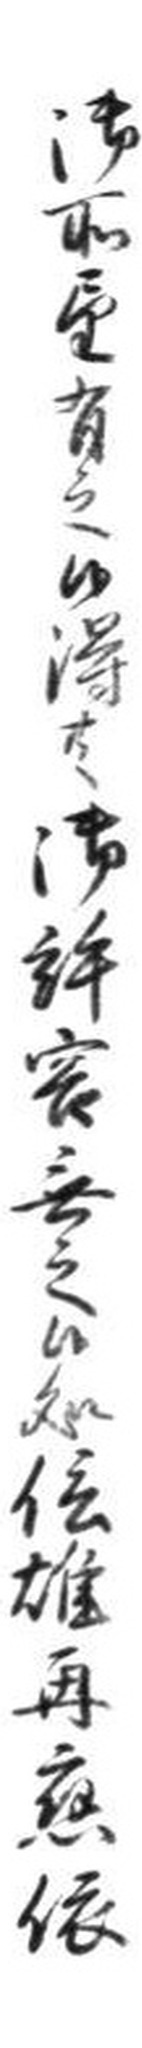御所望有之候得共御許容無之候処信雄再応依
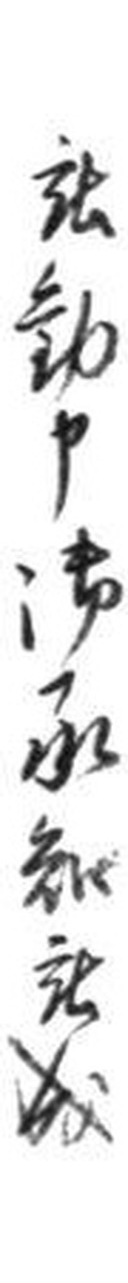被勧申御承知被成
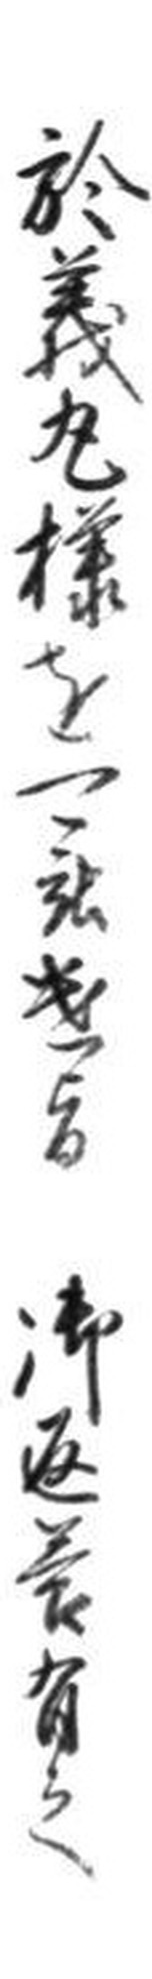於義丸様を可被遣旨御返答有之
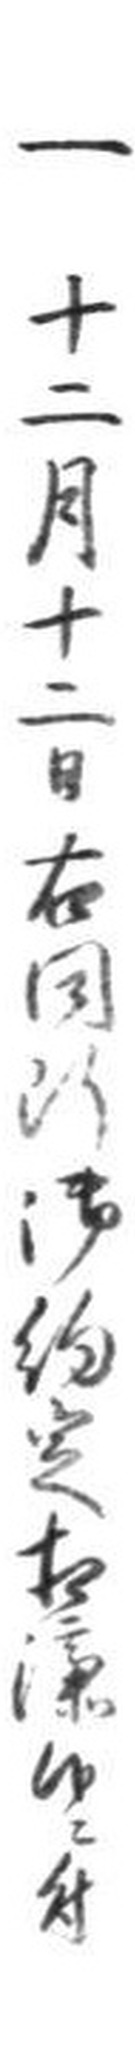一十二月十二日右同断御約定相済候ニ付
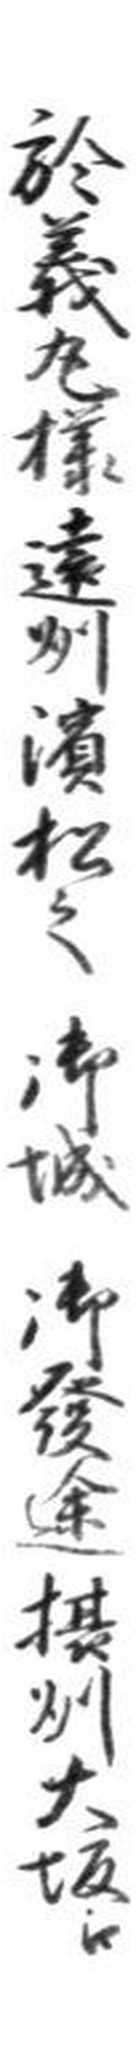於義丸様遠州浜松之御城御発途摂州大坂江
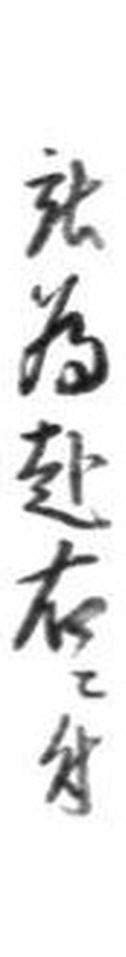被為赴右ニ付
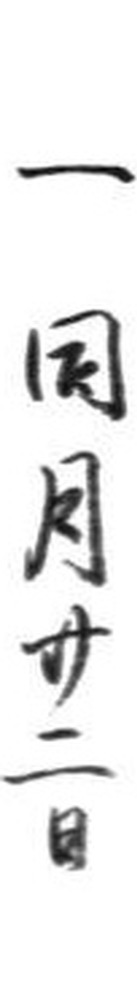一同月廿二日
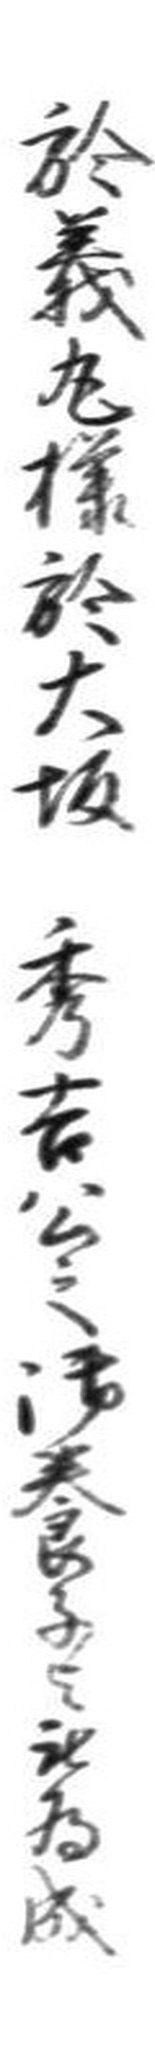於義丸様於大坂秀吉公之御養子与被為成
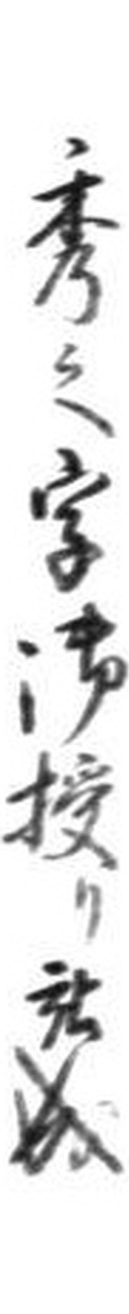秀之字御授り被成
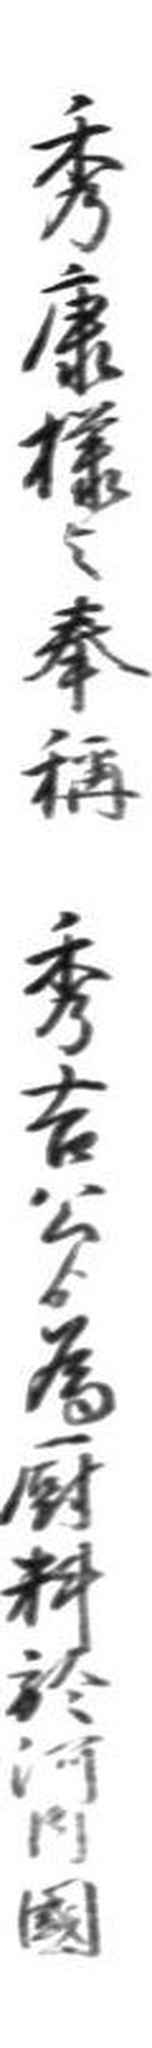秀康様与奉称秀吉公ゟ為厨料於河内国
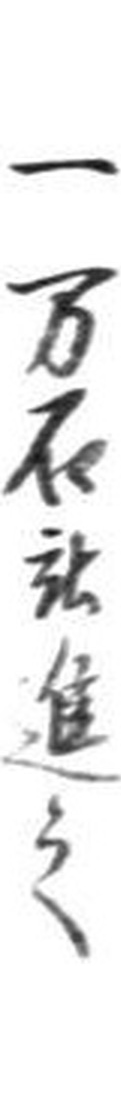一万石被進之

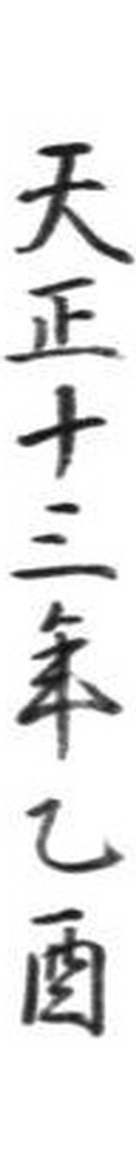天正十三年乙酉
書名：家譜 一 秀康公 従天正二年到慶長十二年
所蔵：福井県文書館 Fukui Prefectural Archives
